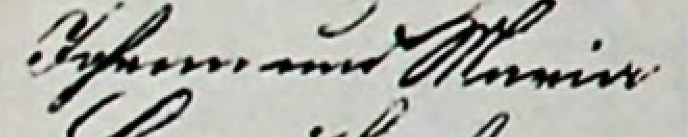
Johann und Maria
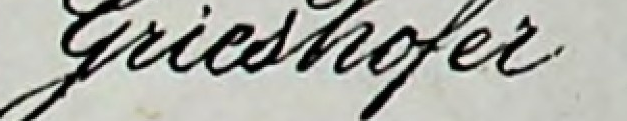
Grieshofer
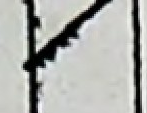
7
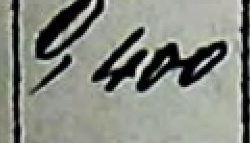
0,400
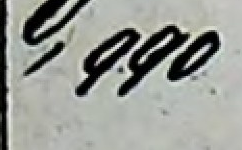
0,990
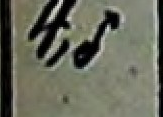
4,5
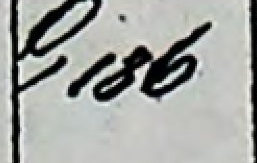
0,186
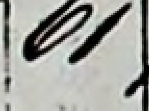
61
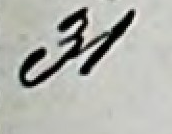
31
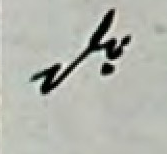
do
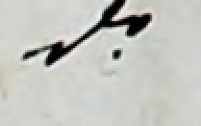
do
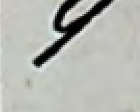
9
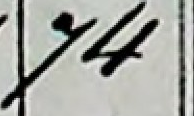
74
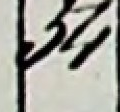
54
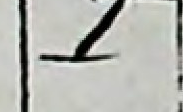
I
